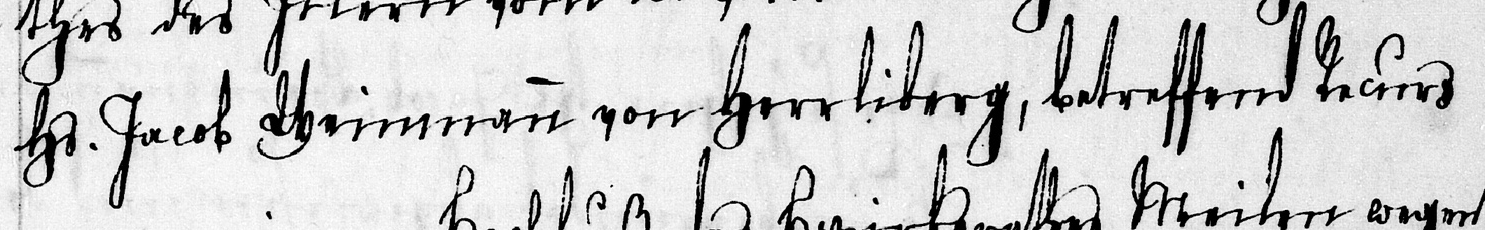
Hs. Jacob Weinmann von Herrliberg, betreffend Recurs
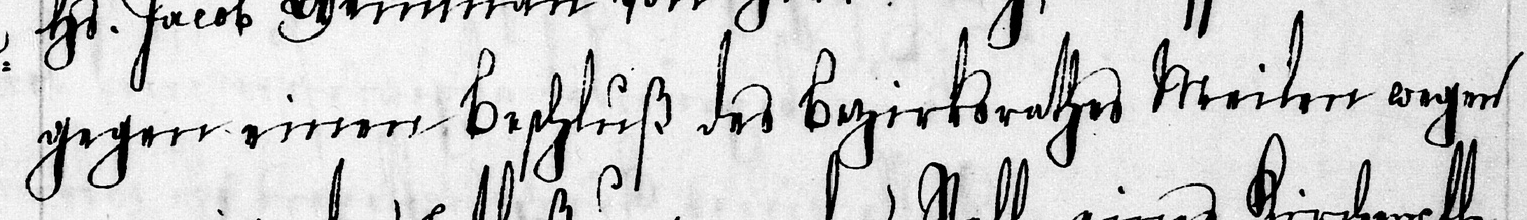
gegen einen Beschluß des Bezirksrathes Meilen wegen
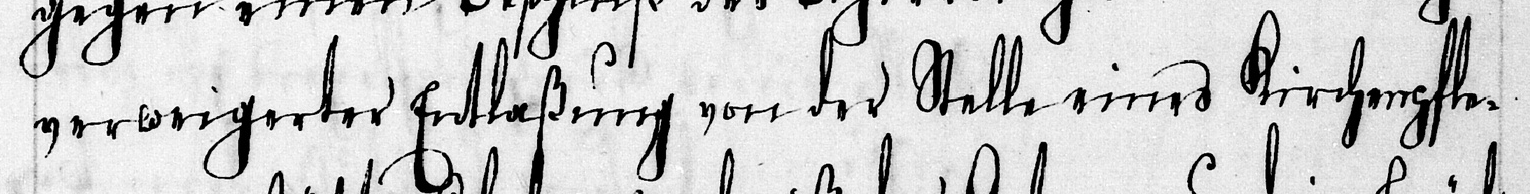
verweigerter Entlaßung von der Stelle eines Kirchenpfle¬
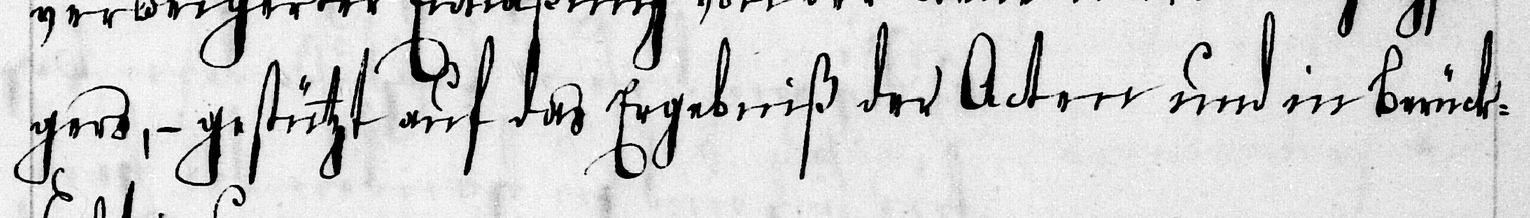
gers, – gestützt auf das Ergebniß der Acten und in Berück¬
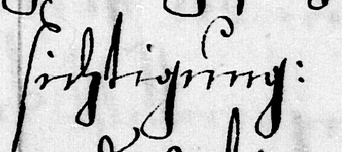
sichtigung:
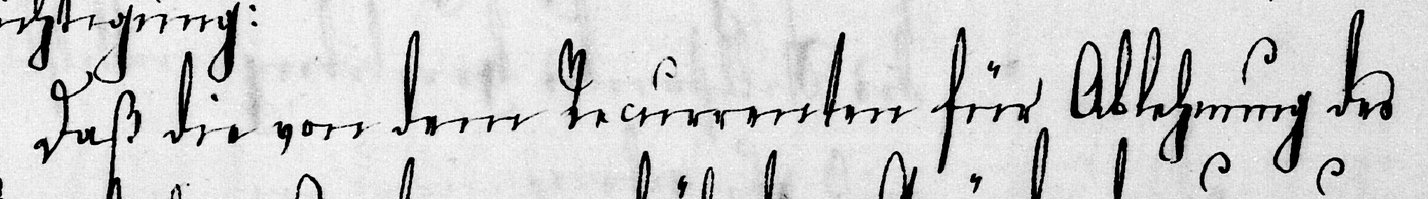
Daß die von dem Recurrenten für Ablehnung des
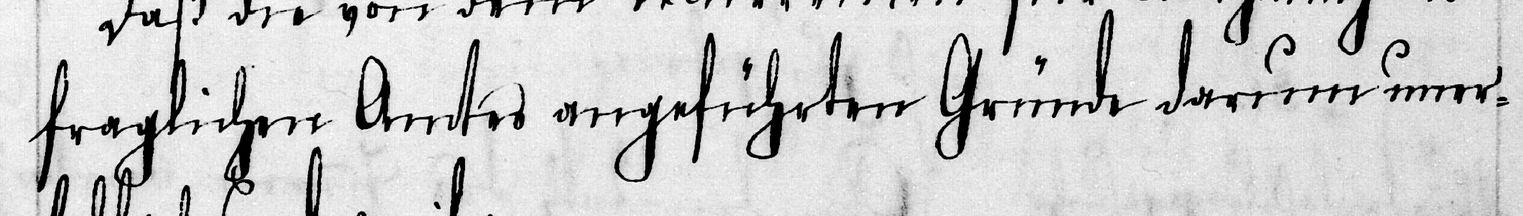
fraglichen Amtes angeführten Gründe darum uner¬
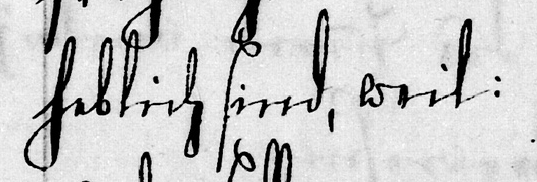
heblich sind, weil:
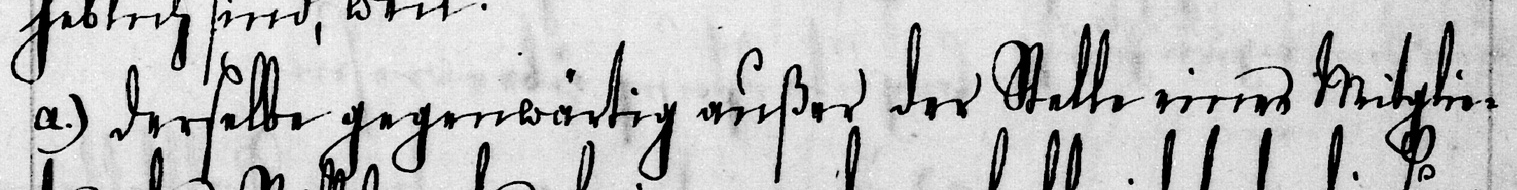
a.) derselbe gegenwärtig außer der Stelle eines Mitglie¬
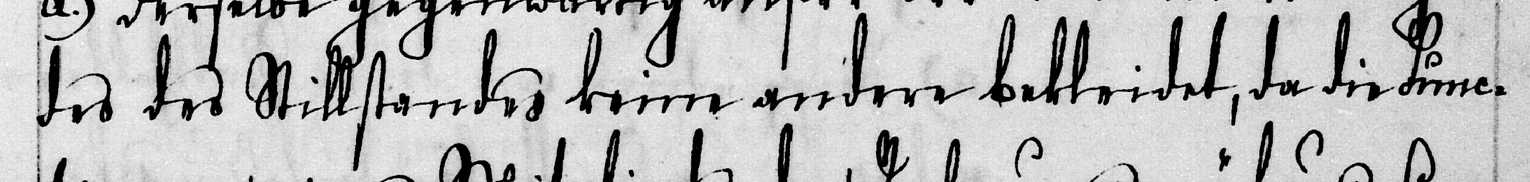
des des Stillstandes keine andere bekleidet, da die Func¬
